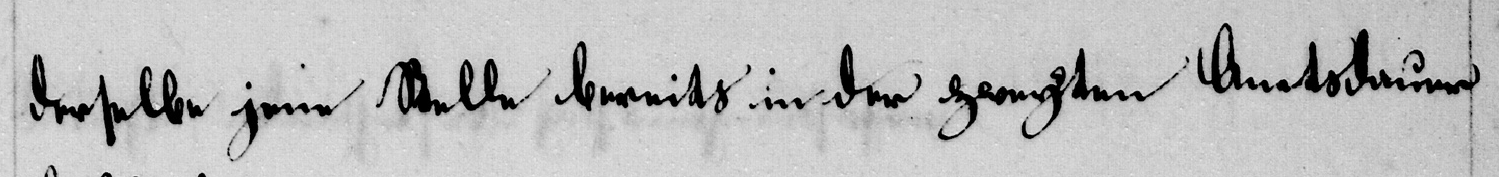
derselbe jene Stelle bereits in der zweyten Amtsdauer
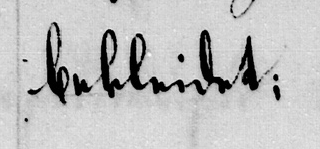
bekleidet;
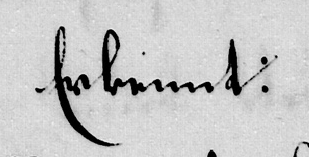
Erkennt:
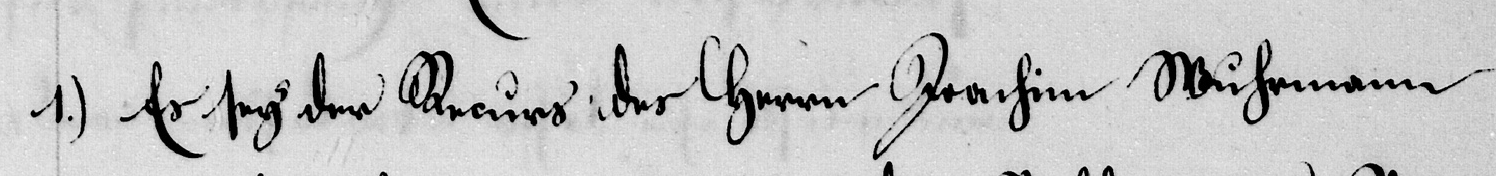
1.) Es sey der Recurs des Herrn Joachim Wuhrmann
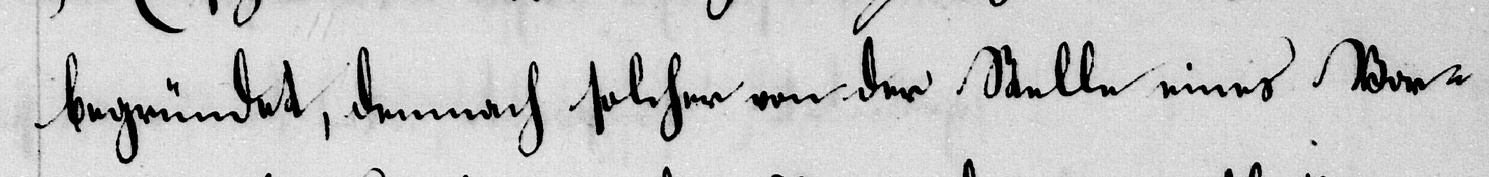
begründet, demnach solcher von der Stelle eines Vor¬
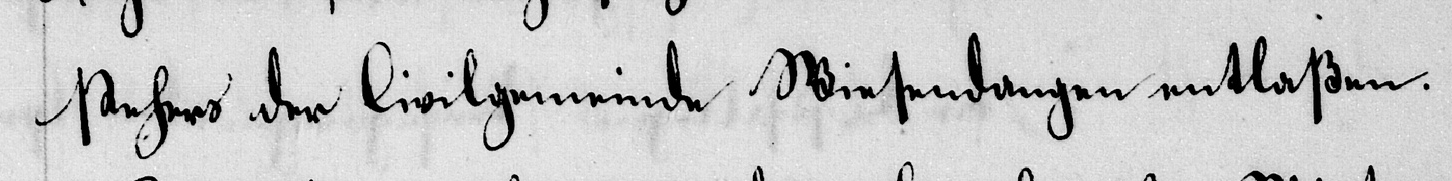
stehers der Civilgemeinde Wiesendangen entlaßen.
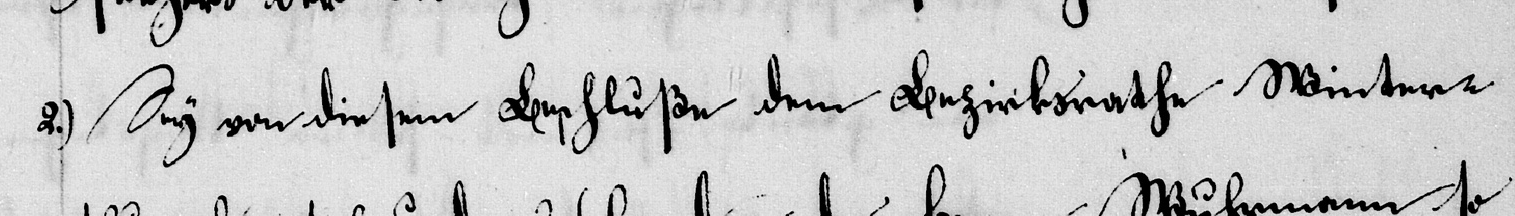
2.) Sey von diesem Beschluße dem Bezirksrathe Winter¬
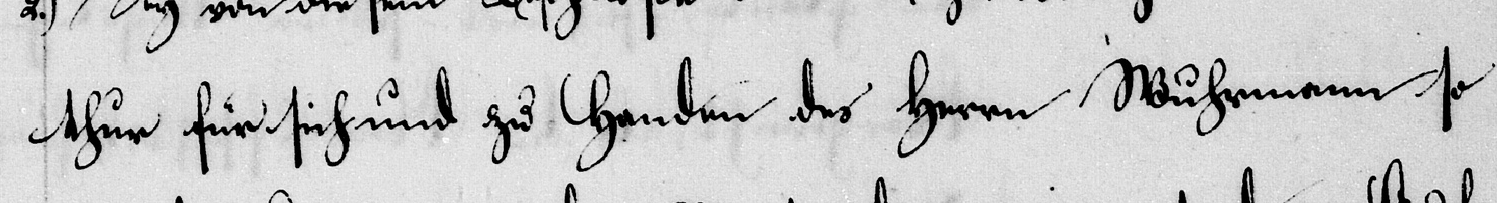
thur für sich und zu Handen des Herrn Wuhrmann so¬
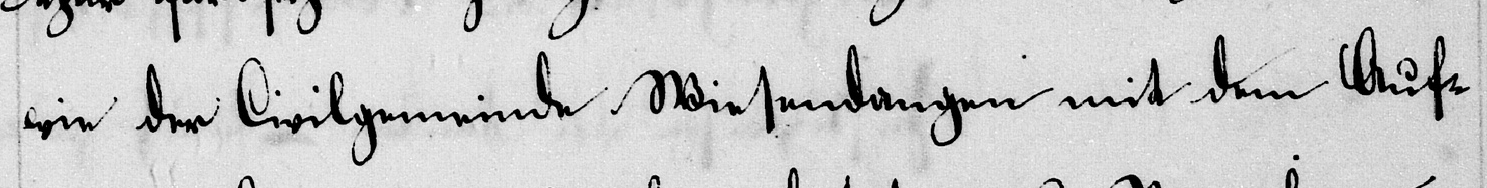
wie der Civilgemeinde Wiesendangen mit dem Auf¬
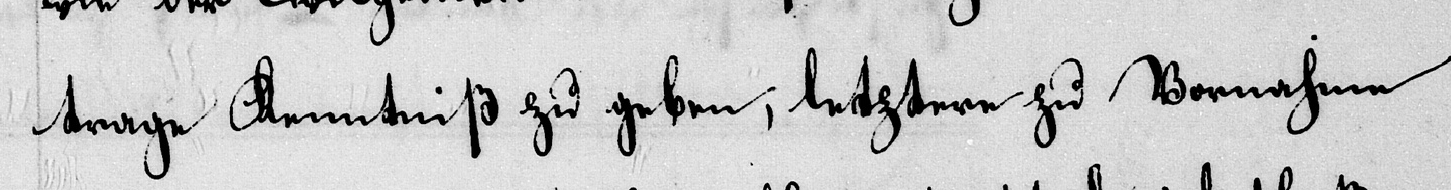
trage Kenntniß zu geben, letzteren zu Vornahme
